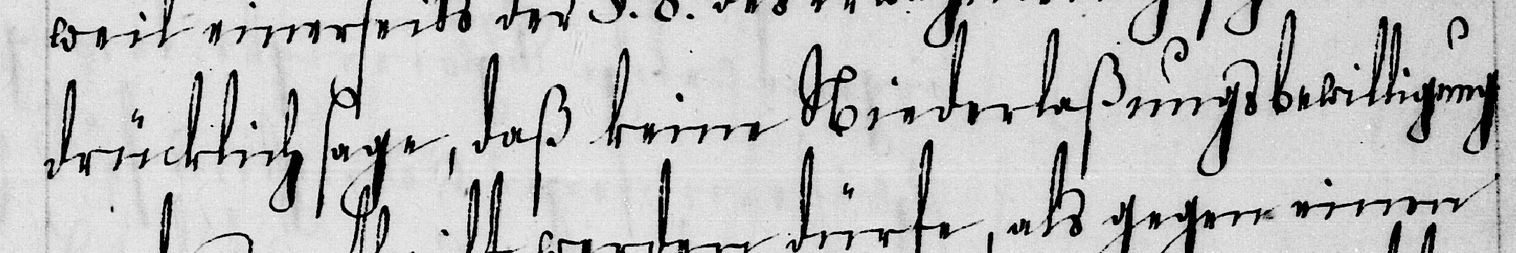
drücklich sage, daß keine Niederlaßungsbewilligung
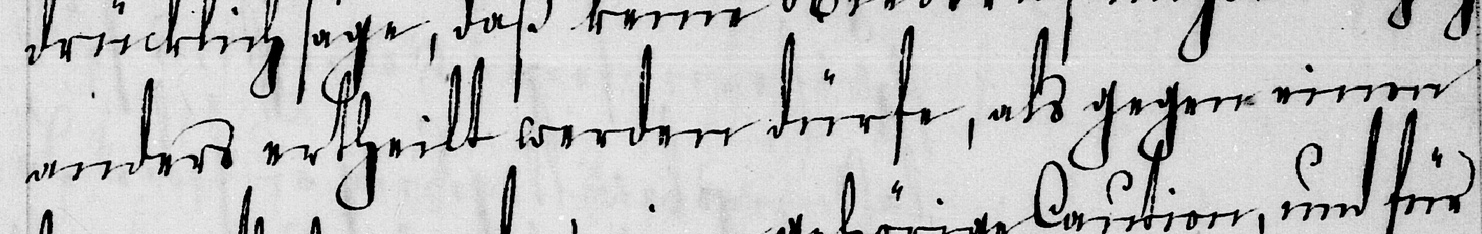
anders ertheilt werden dürfe, als gegen einen
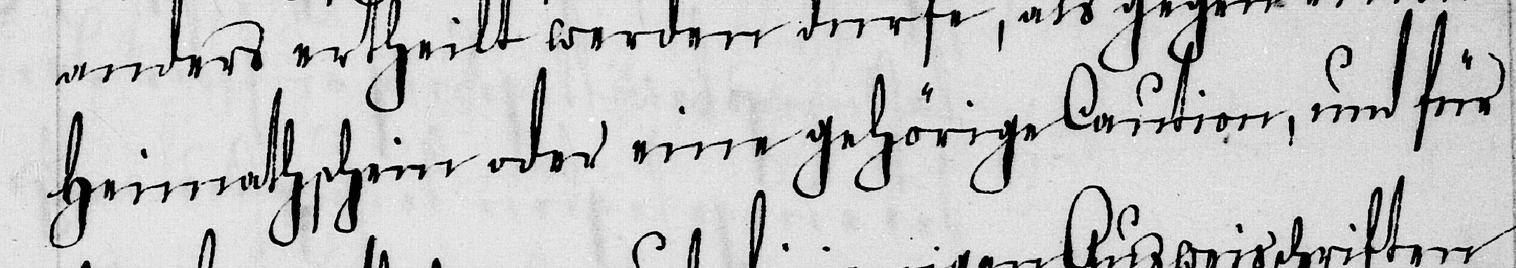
Heimathschein oder eine gehörige Caution, und für
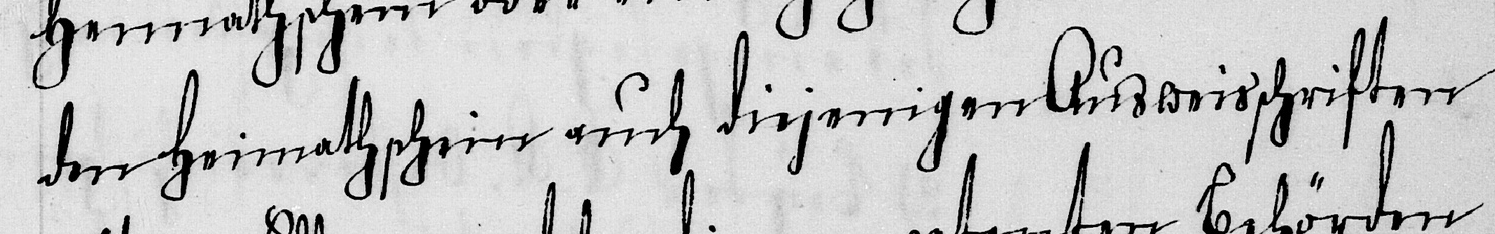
den Heimathschein auch diejenigen Ausweisschriften
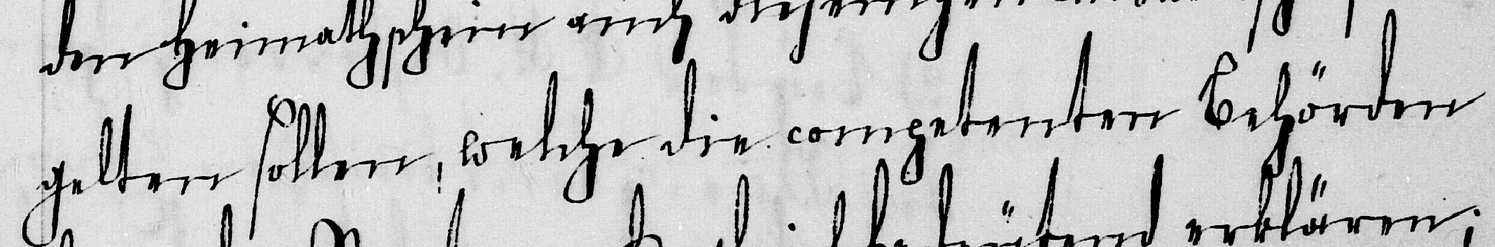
gelten sollen, welche die competenten Behörden
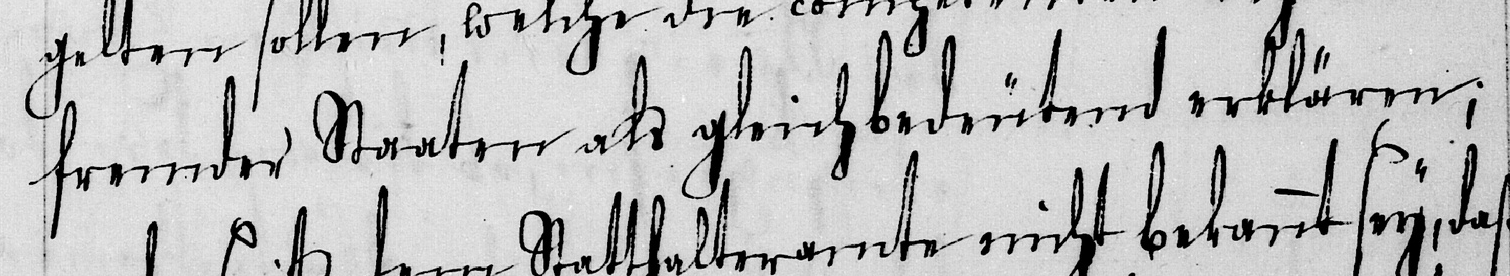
fremder Staaten als gleichbedeutend erklären;
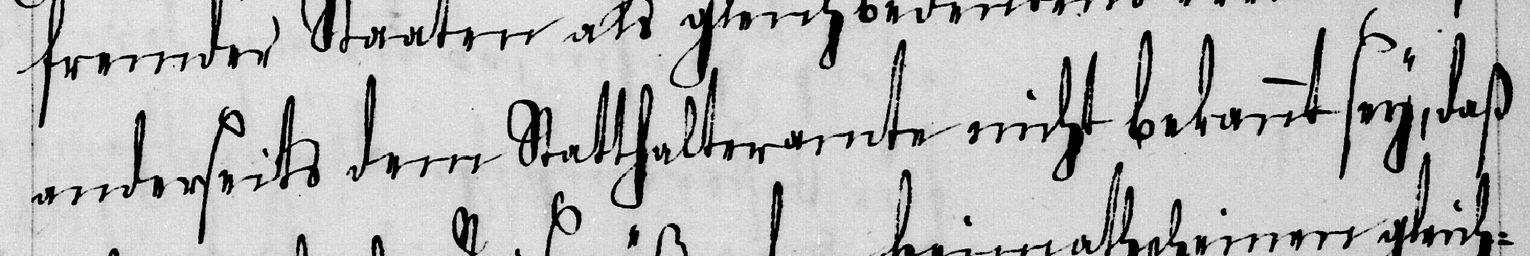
anderseits dem Statthalteramte nicht bekannt sey, daß
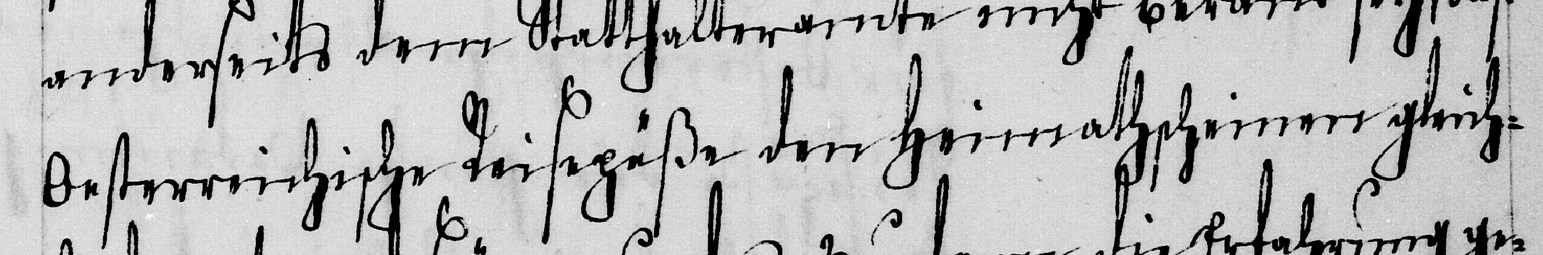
Oesterreichische Reisepäße den Heimathscheinen gleich¬
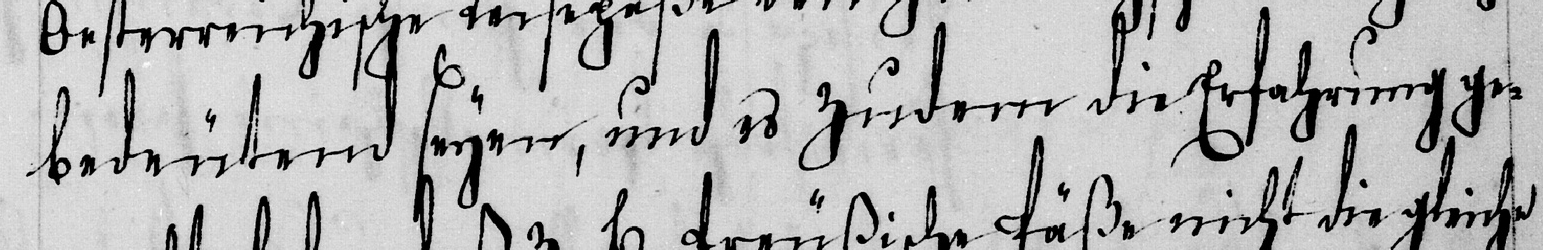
bedeutend seyen, und es zudem die Erfahrung ge¬
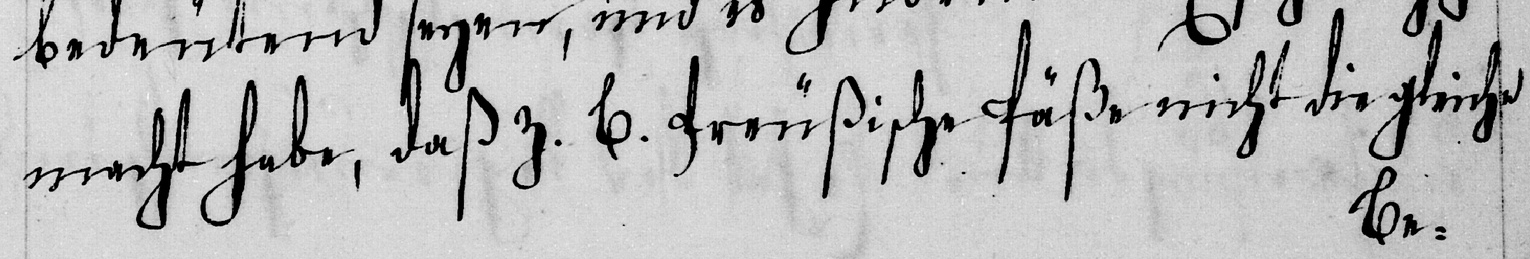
macht habe, daß z. B. Preußische Päße nicht die gleic¬
